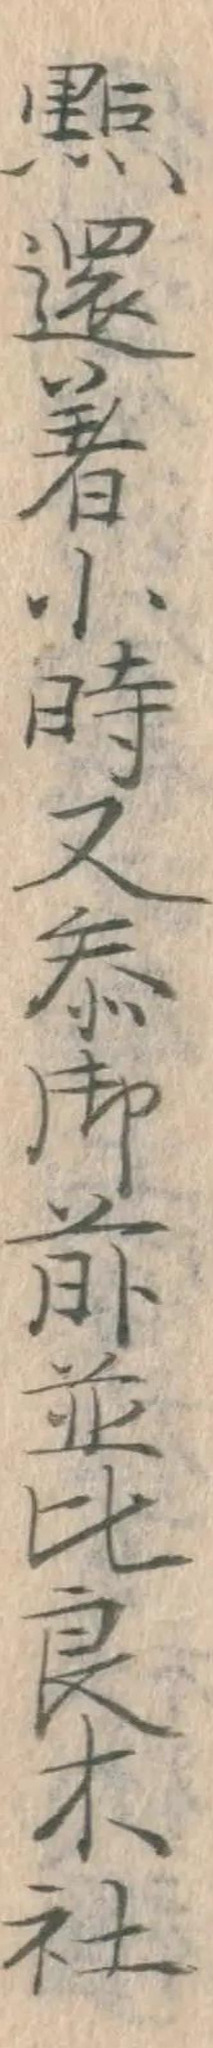点還着小時又参御前並比良木社
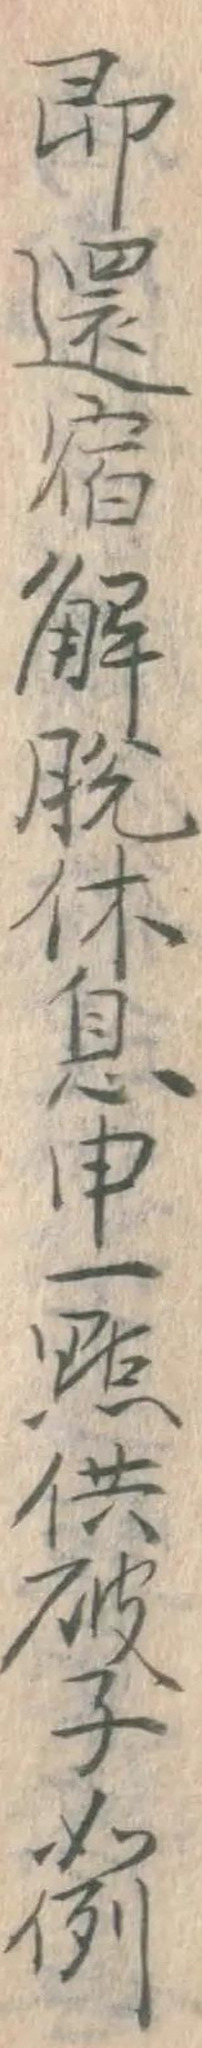即還宿解脱休息申一点供破子如例
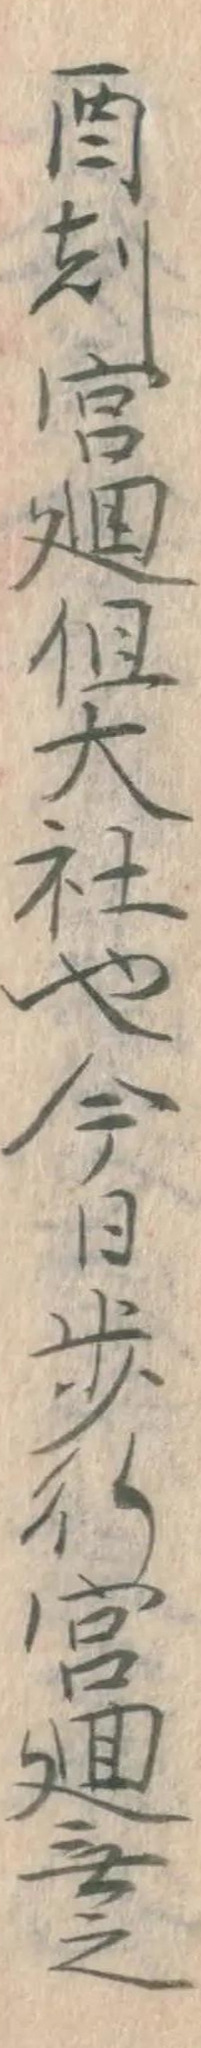酉刻宮廻但大社也今日歩行宮廻無之
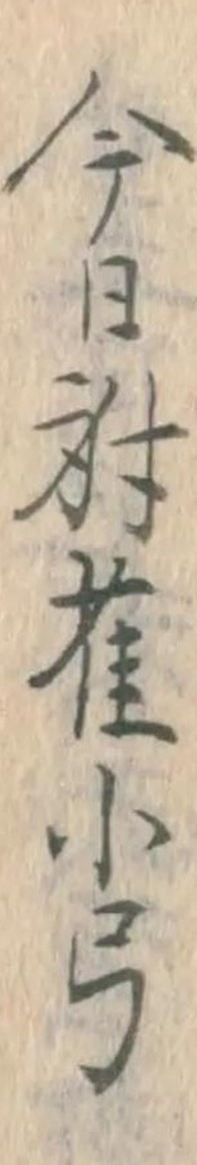今日射雀小弓

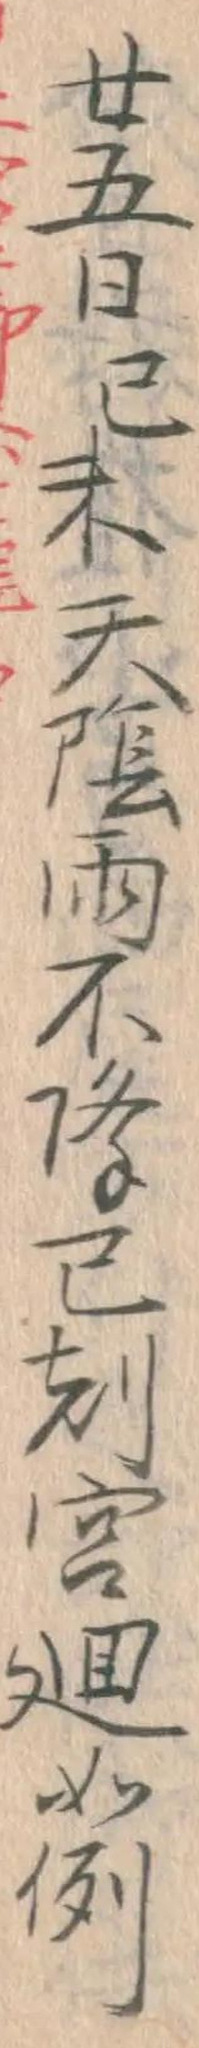廿五日己未天陰雨不降巳刻宮廻如例
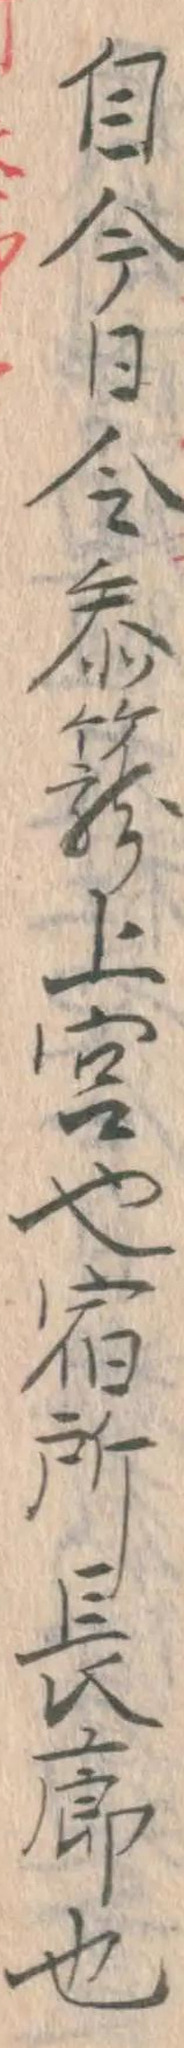自今日令参籠上宮也宿所長廊也
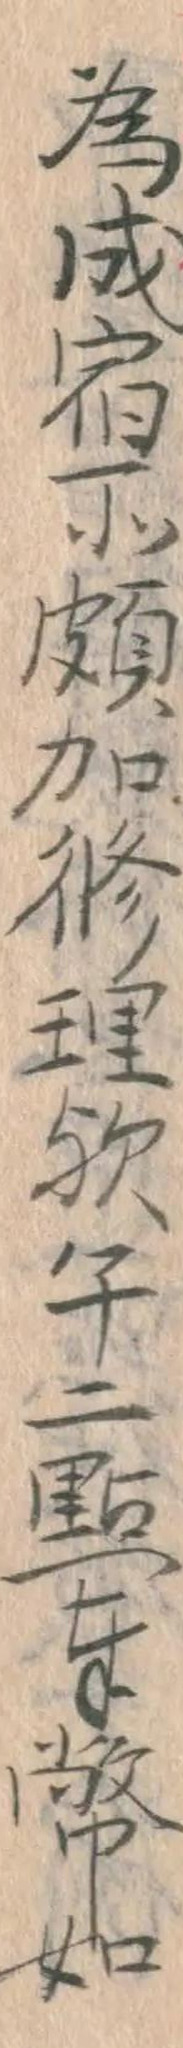為成宿所頗加修理歟午二点奉幣如
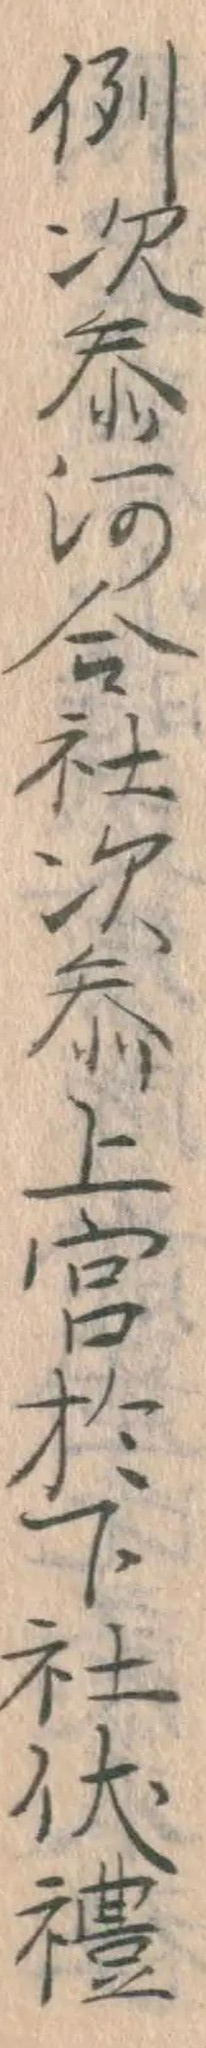例次参河合社次参上宮於下社伏礼
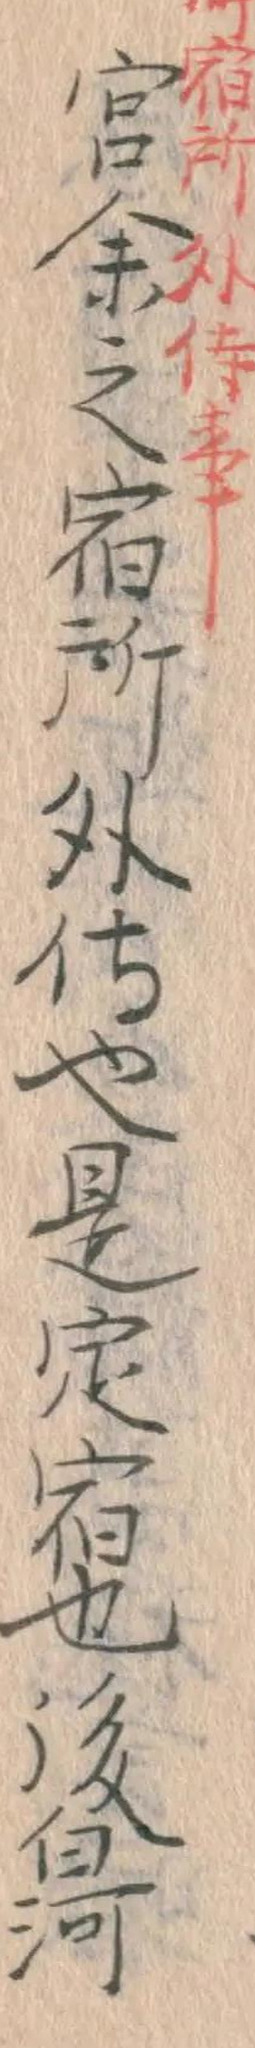宮余之宿所外侍也是定宿也後白河
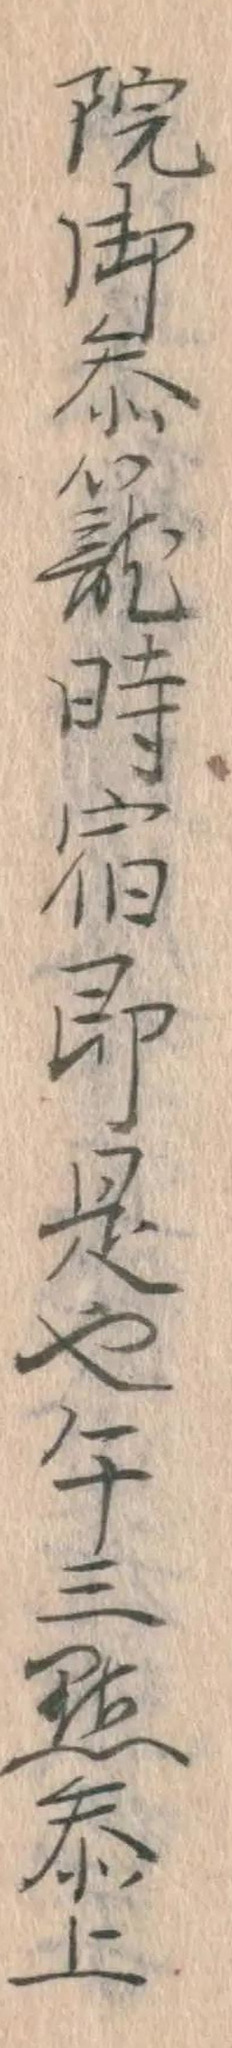院御参籠時宿即是也午三点参上
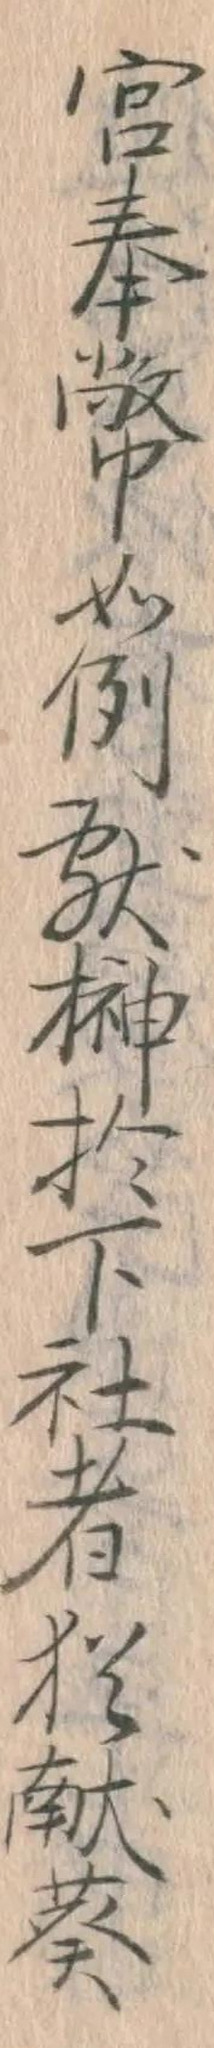宮奉幣如例献榊於下社者猶献葵
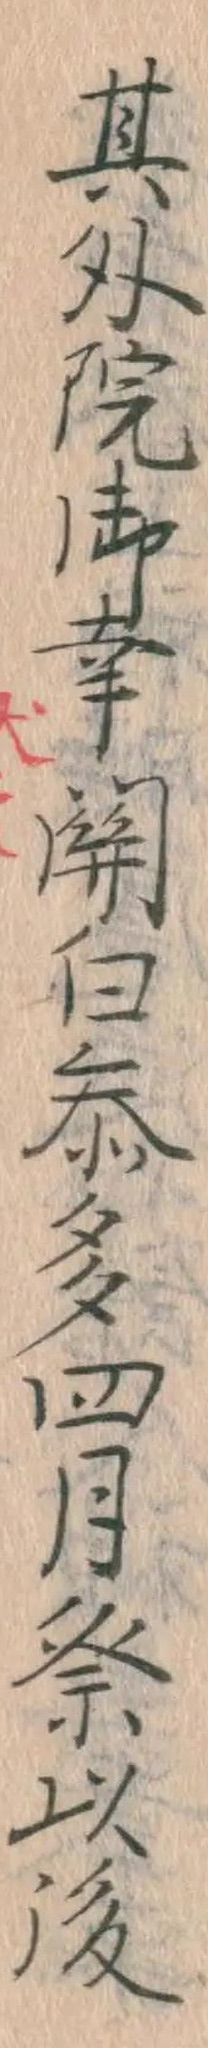其外院御幸関白参多四月祭以後
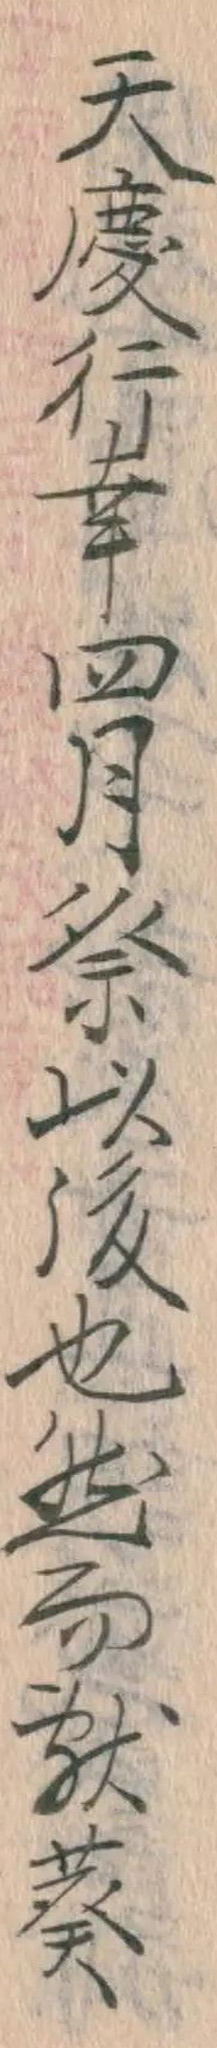天慶行幸四月祭以後也然而献葵
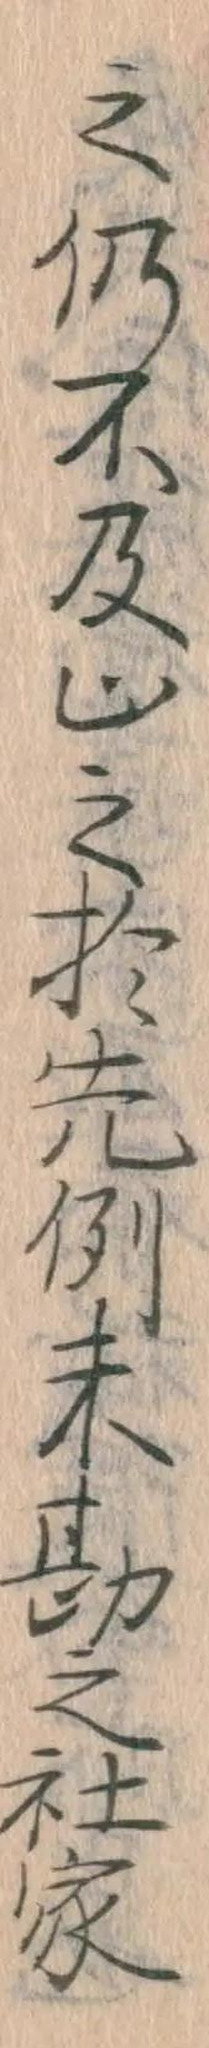之仍不及止之於先例未勘之社家
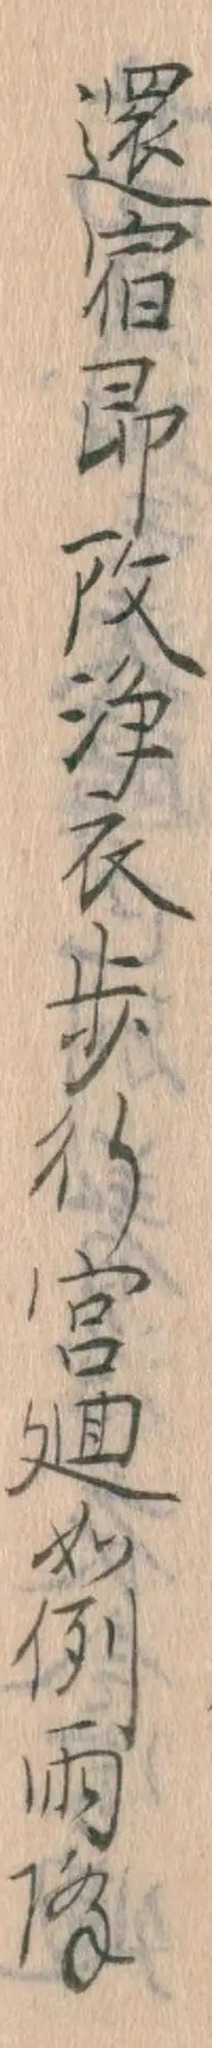還宿即改浄衣歩行宮廻如例雨降
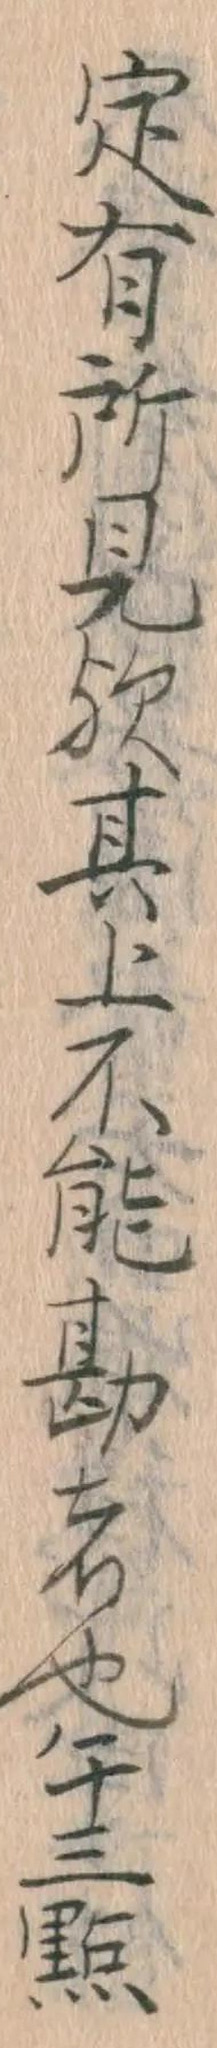定有所見歟其上不能勘者也午三点
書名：賀茂社記録. 第80冊
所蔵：国立国会図書館 National Diet Library, JAPAN
